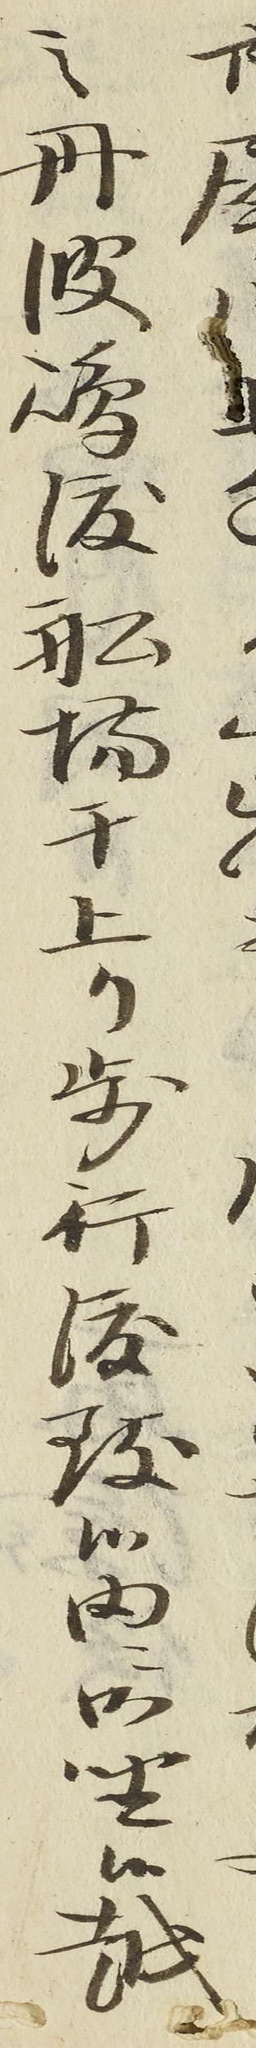之丹波嶋渡船場干上り歩行渡致候由二御坐候越
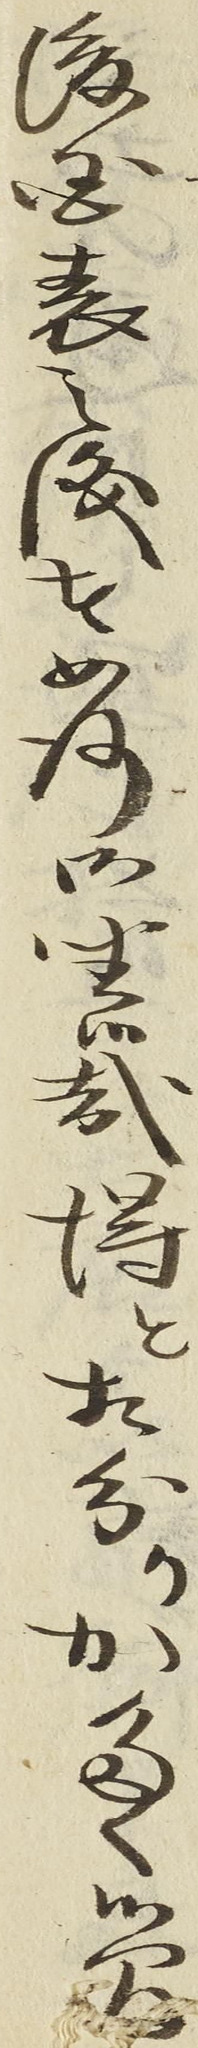後国表之儀は如何御坐候哉様得と分りかたく候間
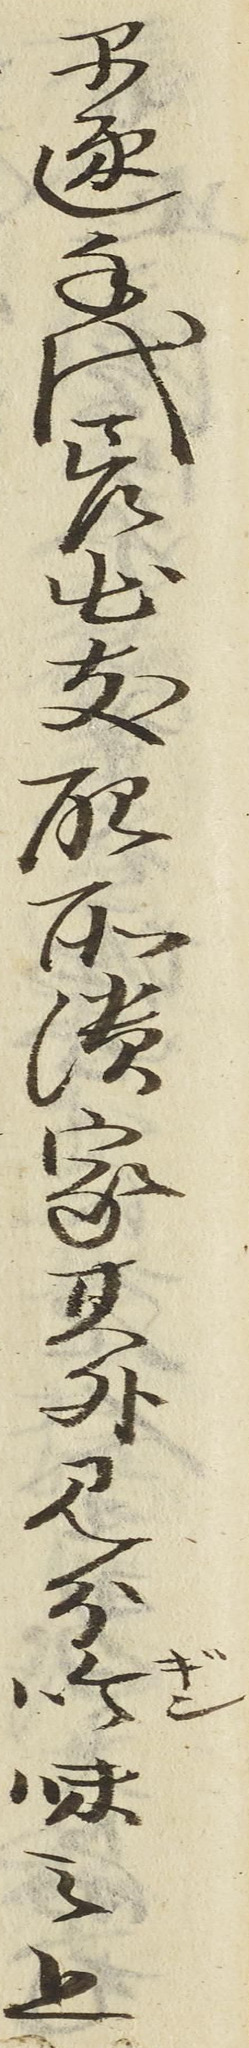早速手代差出支配所潰家其外見分吟味之上
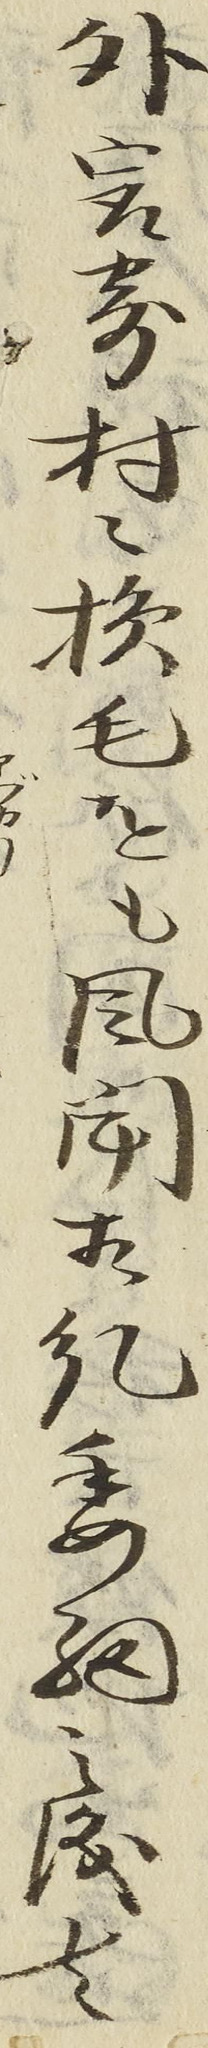外最寄村々損亡をも風聞相糺委細之儀ハは
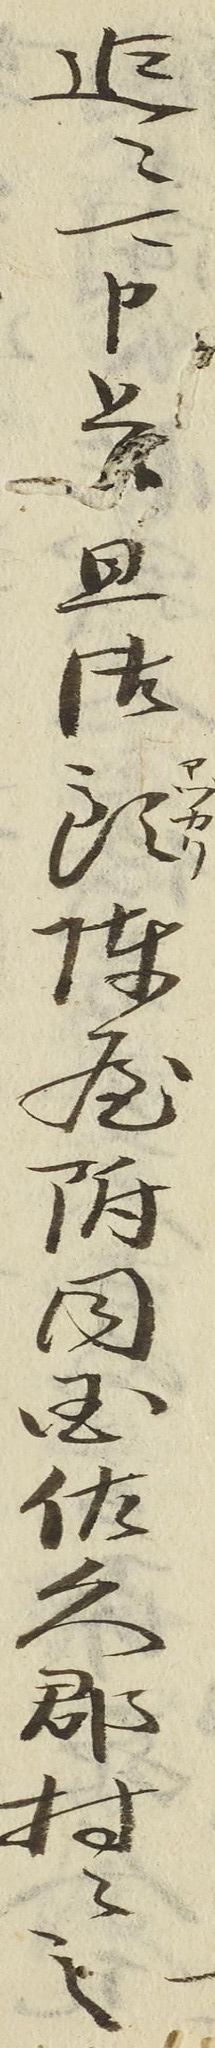追々可申上候且御預陣屋付同国佐久郡村々之
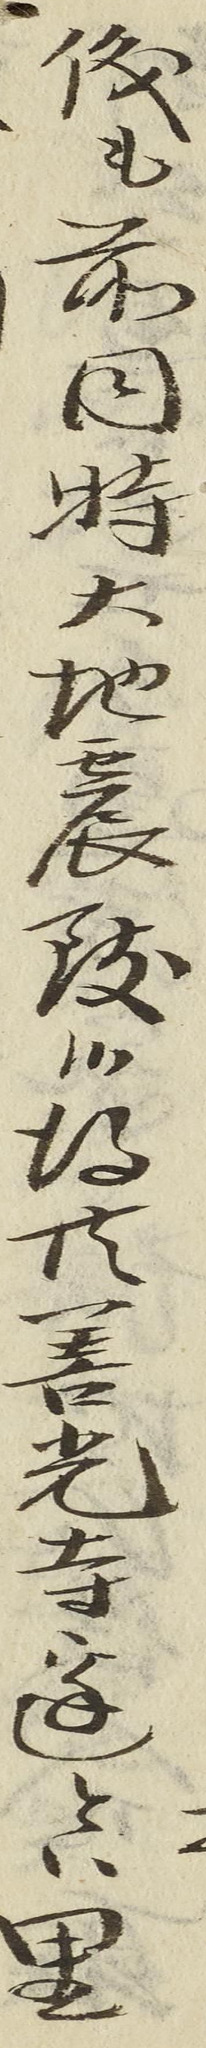儀も前同時大地震致候得共善光寺辺とハ里
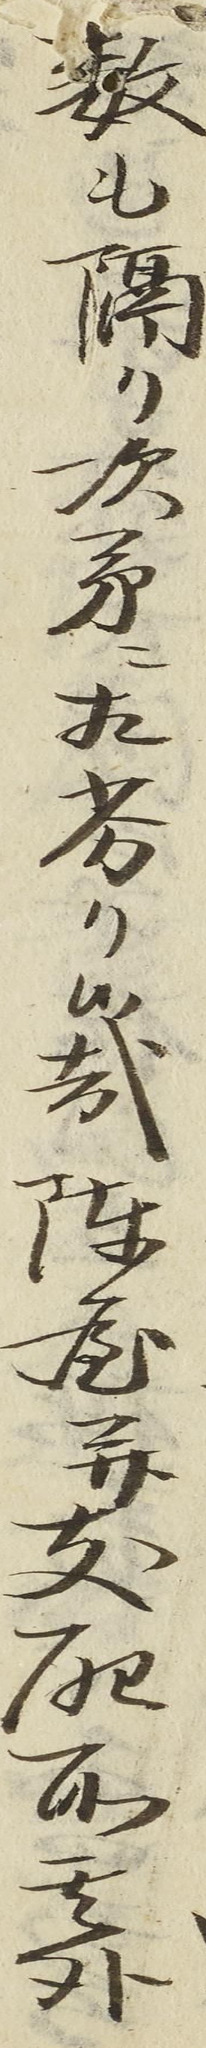数も隔り次第二相劣り候哉陣屋并支配所其外
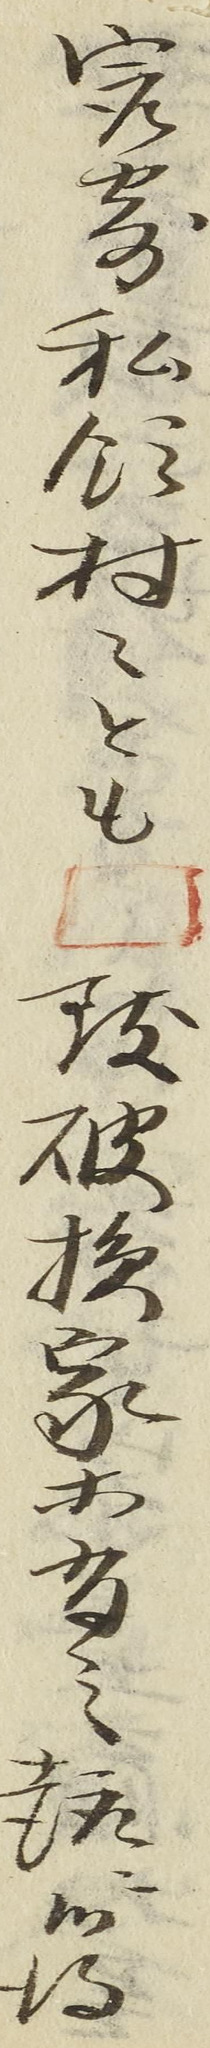最寄私領村々とも口致破損家等有之趣候得共
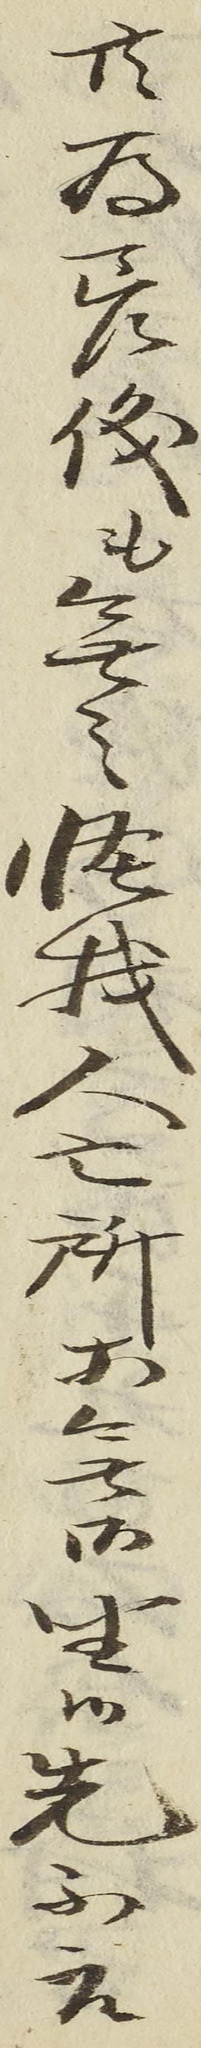共為差儀も無之怪我人亡所等無御坐候先不取
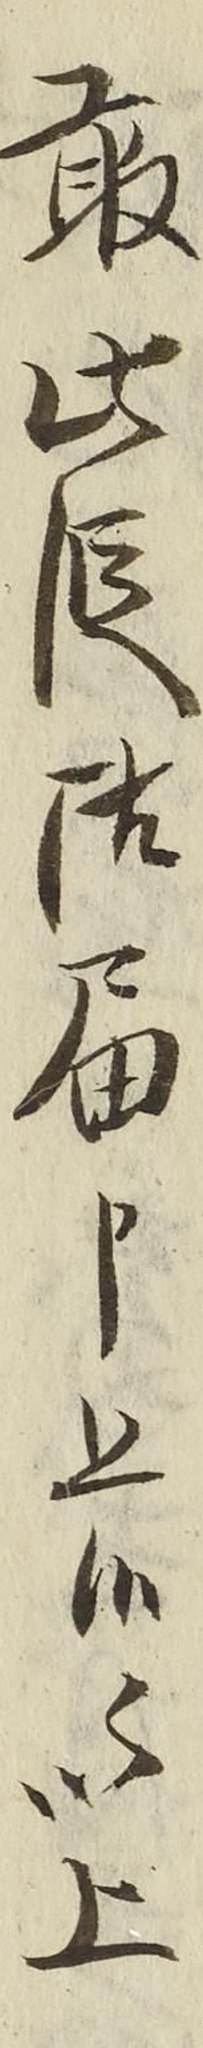敢此段御届真上候以上
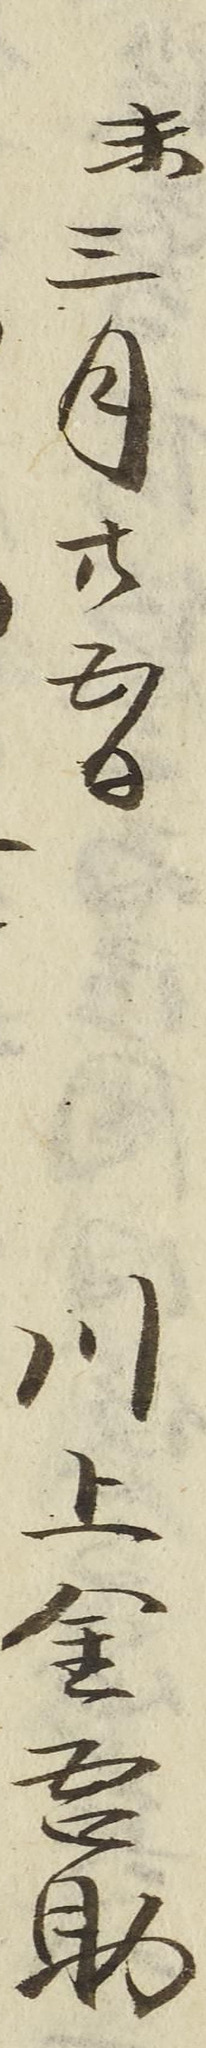未三月廿五日川上金吾助
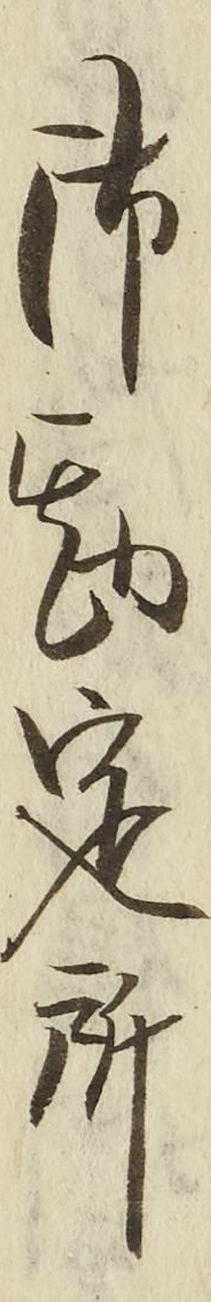御勘定所
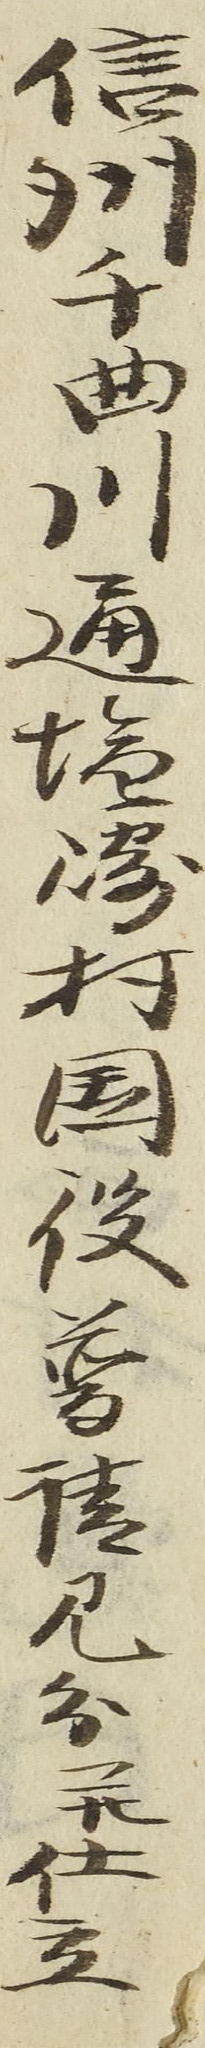信州千曲川通塩崎村国役普請見分并仕立
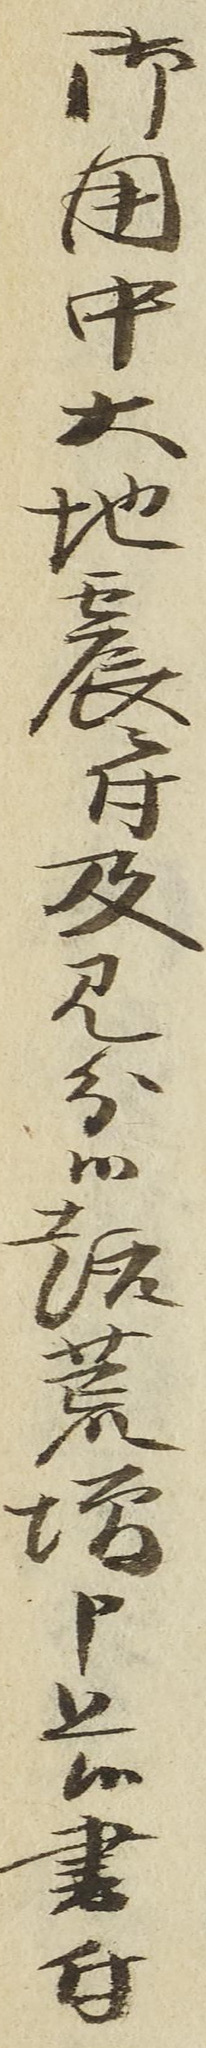御用中大地震二付見分候趣荒増真上候書付

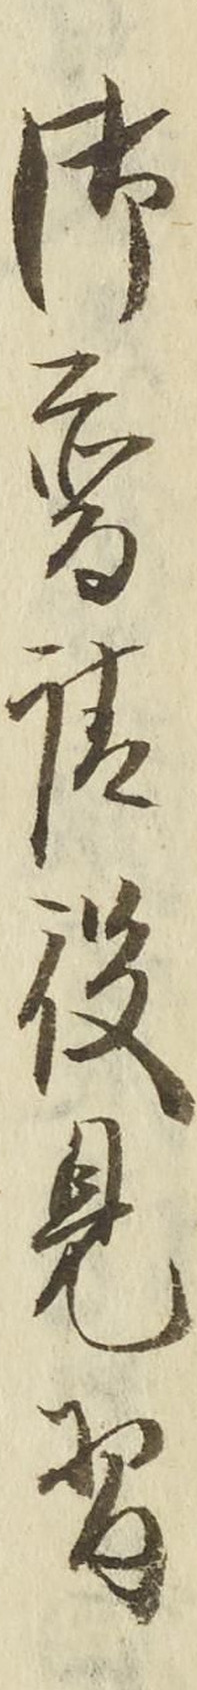御普請役見習
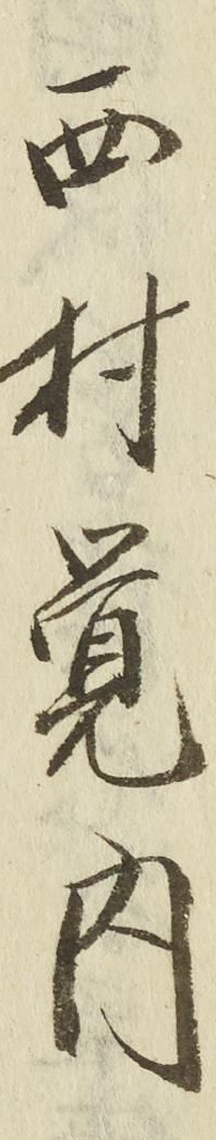西村覚内
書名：信濃國大地震記　乾
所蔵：東京大学地震研究所図書室 Earthquake Research Institute Library, The University of Tokyo, JAPAN
